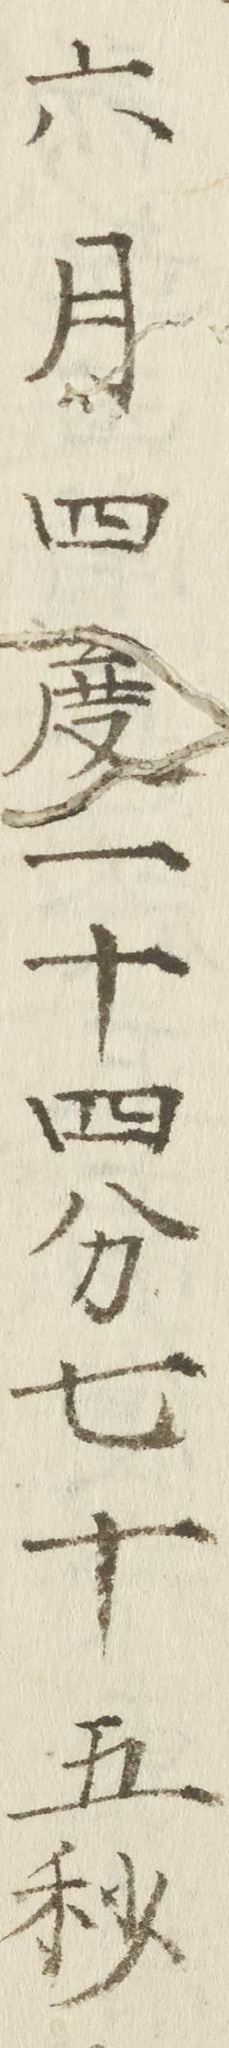六月四度一十四分七十五秒
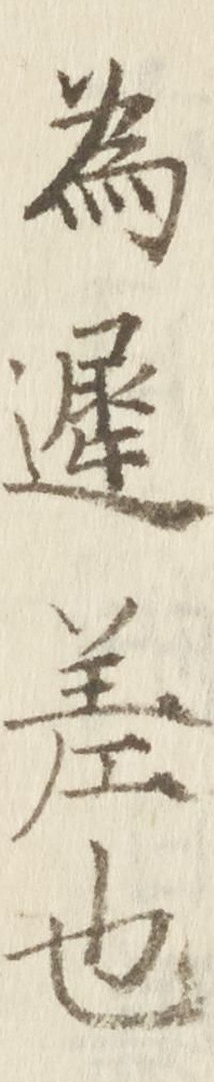為遅差也
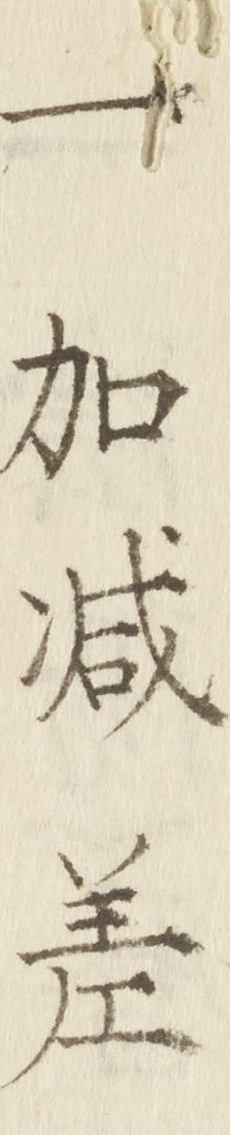一加減差
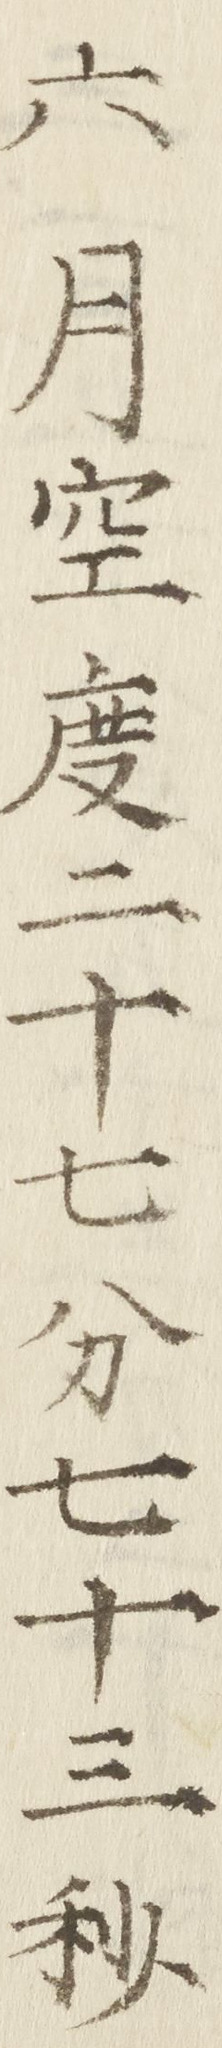六月空度二十七分七十三秒
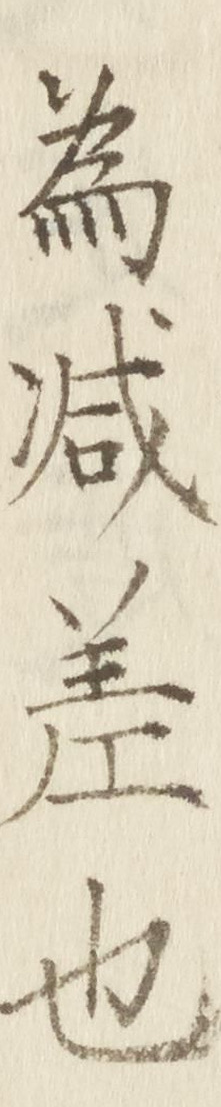為減差也
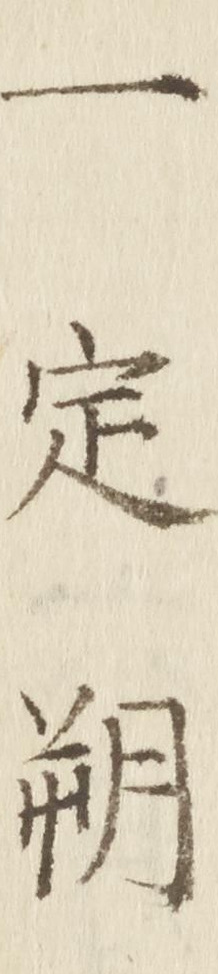一定朔
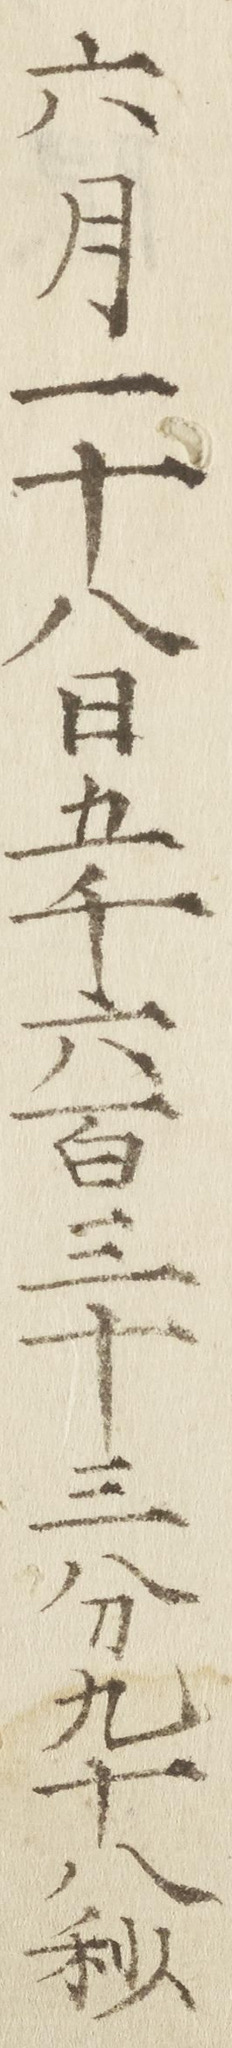六月一十八日五千六百三十三分九十八秒

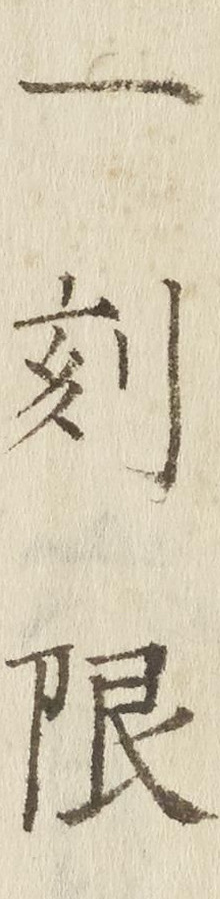一刻限
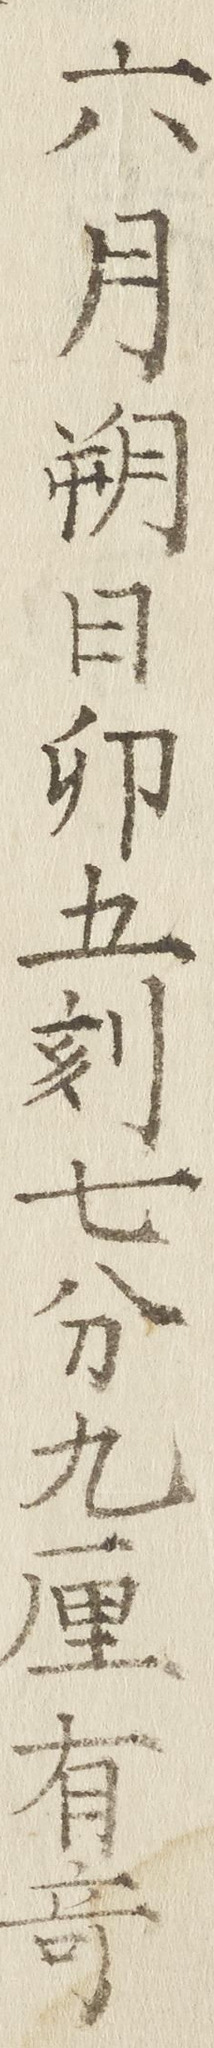六月朔日卯五刻七分九厘有奇
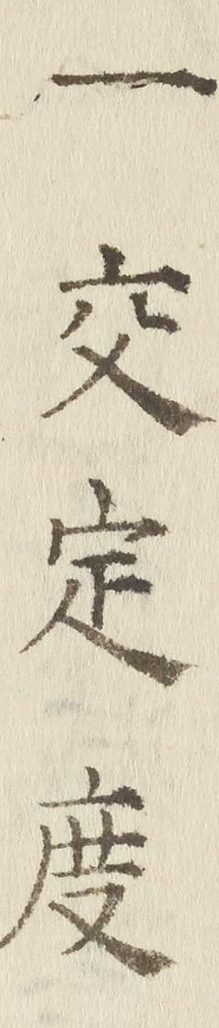一交定度
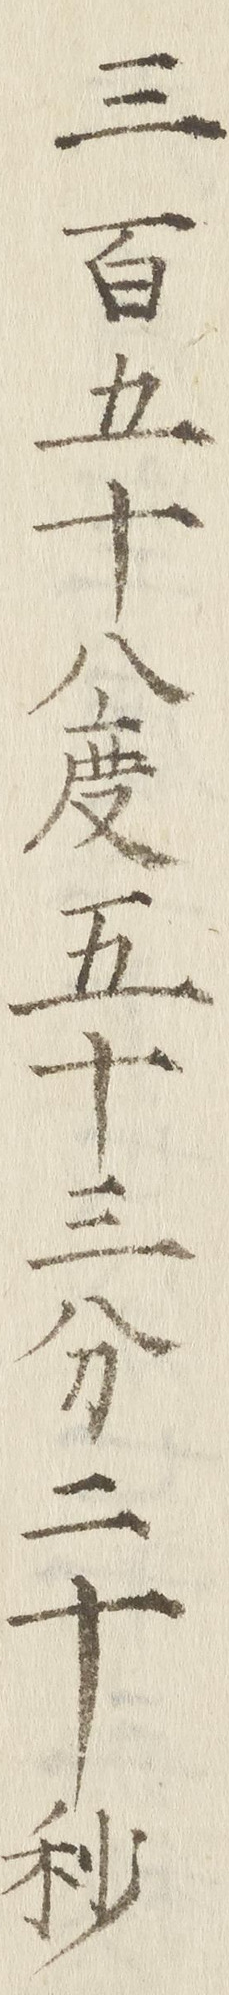三百五十八度五十三分二十秒
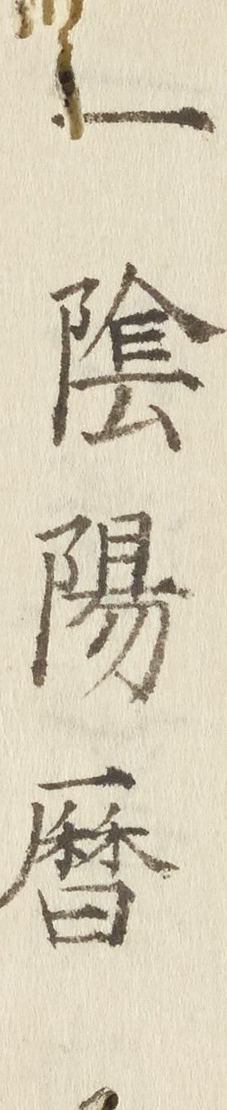一陰陽暦
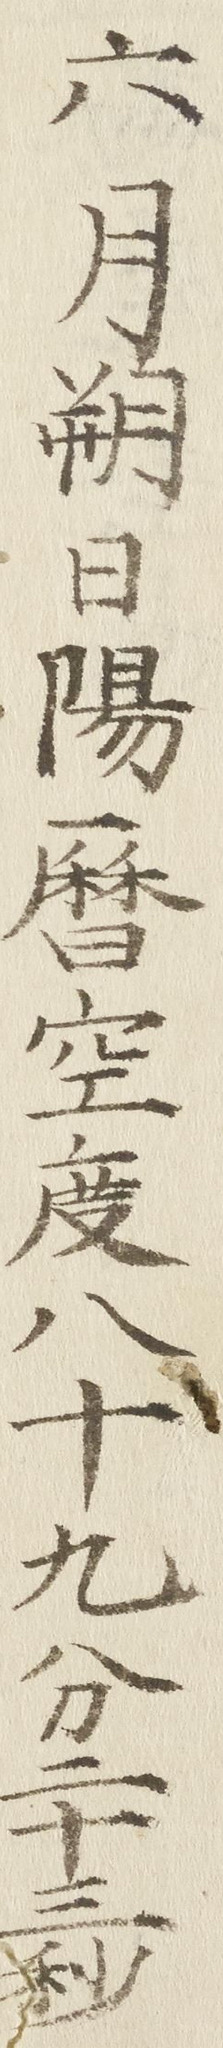六月朔日陽暦空度八十九分二十三秒
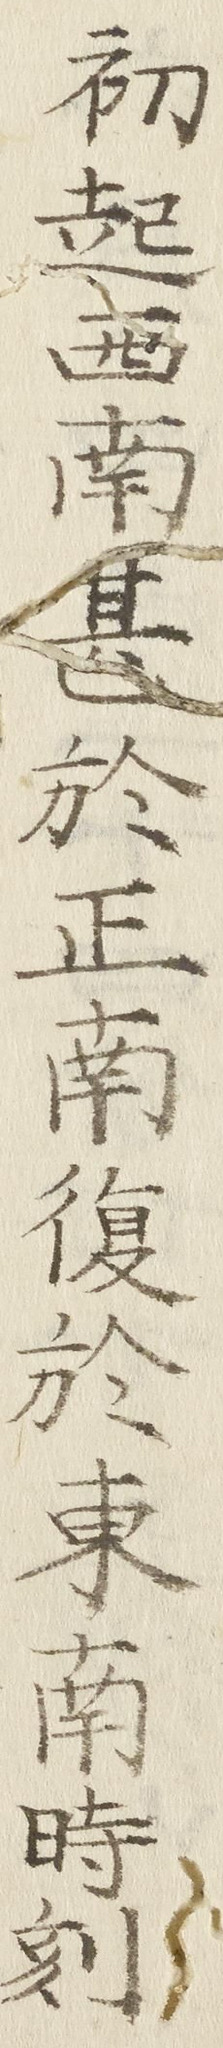初起西南甚於正南復於東南時刻
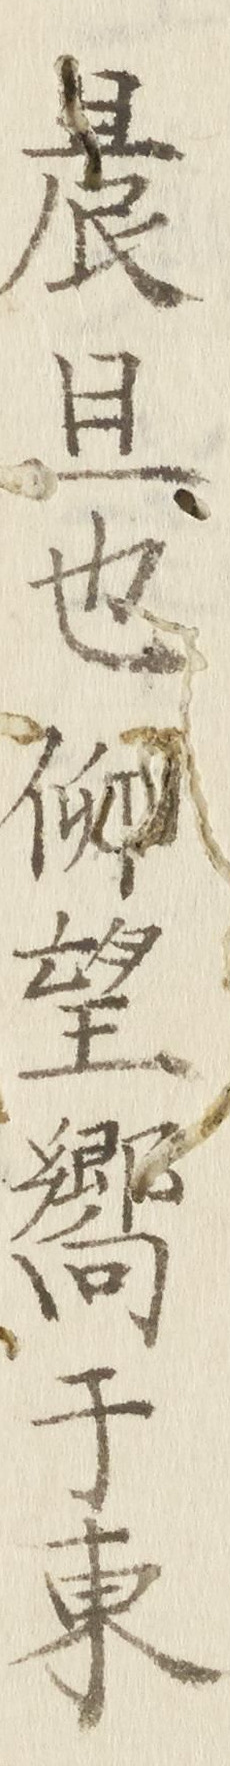晨旦也仰望嚮于東
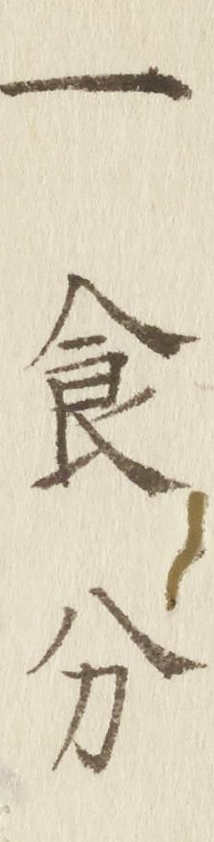一食分
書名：日食度
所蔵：東京大学地震研究所図書室 Earthquake Research Institute Library, The University of Tokyo, JAPAN
